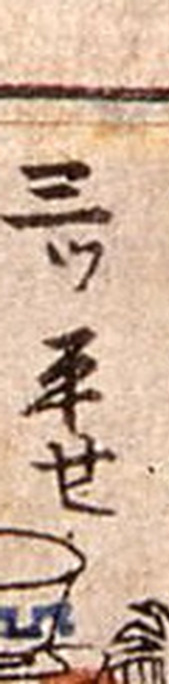三つ平せ
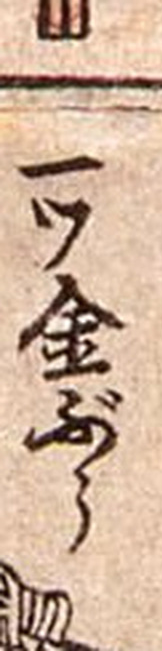一つ金ぶら
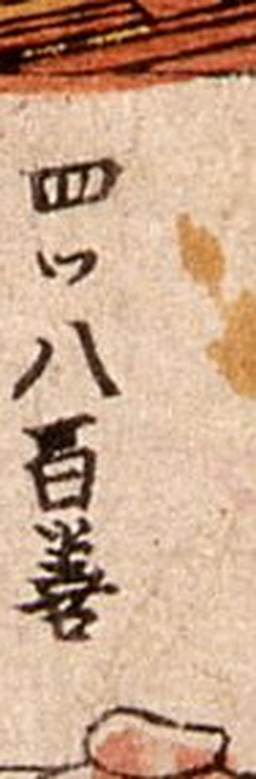四つ八百善
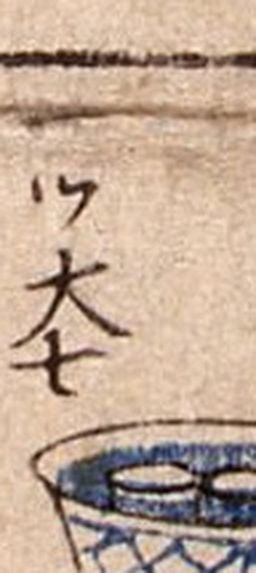一つ大七
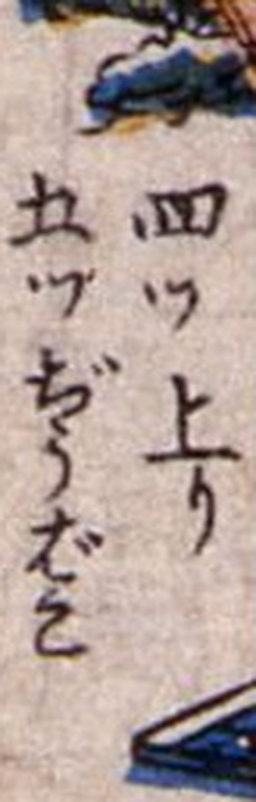五つぢうばこ
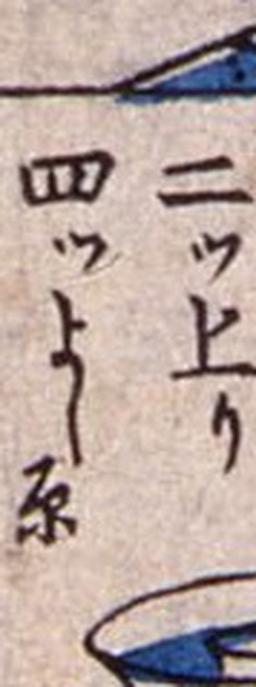四つよし原
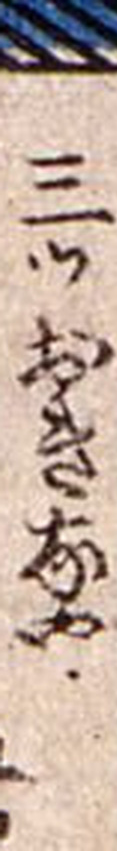三つおきなや
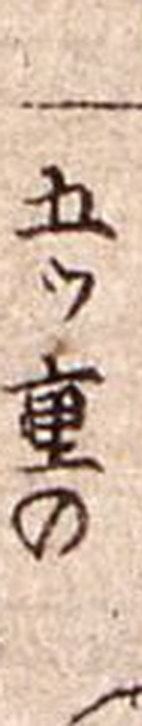五つ重のし
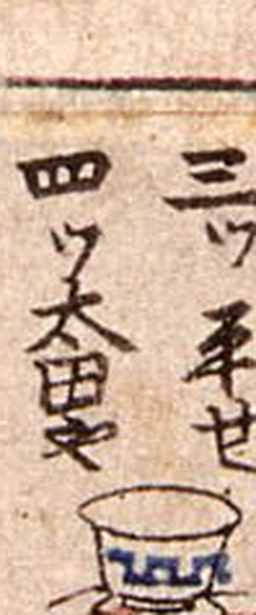四つ太田や
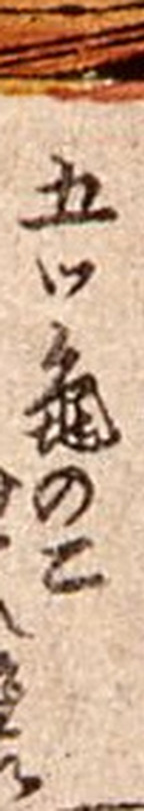五つ重のし
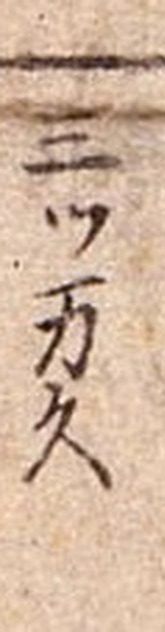三つ万久
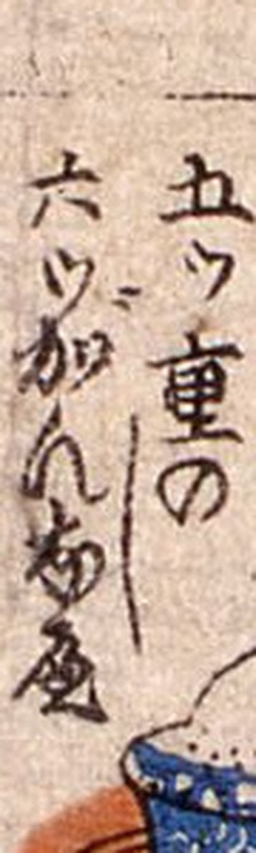六つがんなべ
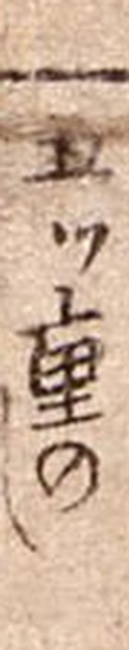五つ重のし
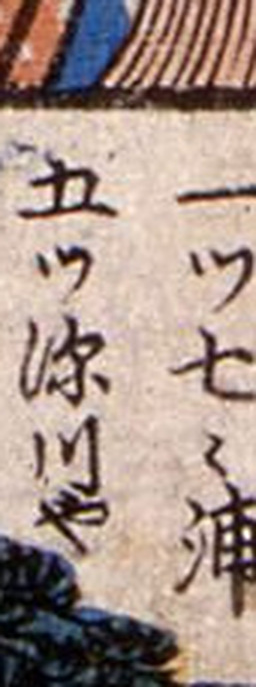五つ深川や
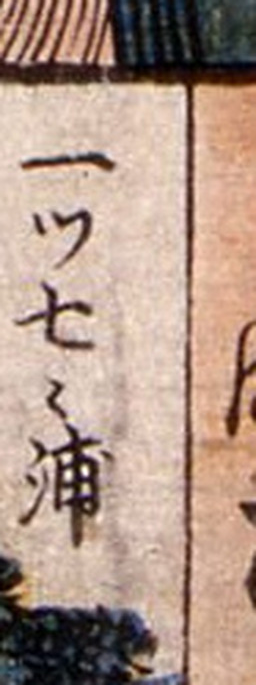一つ七々浦
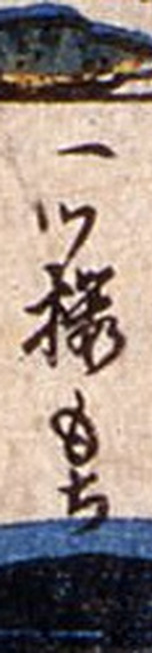一つ桜もち
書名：新版御府内流行名物案内雙六
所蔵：東京学芸大学附属図書館
